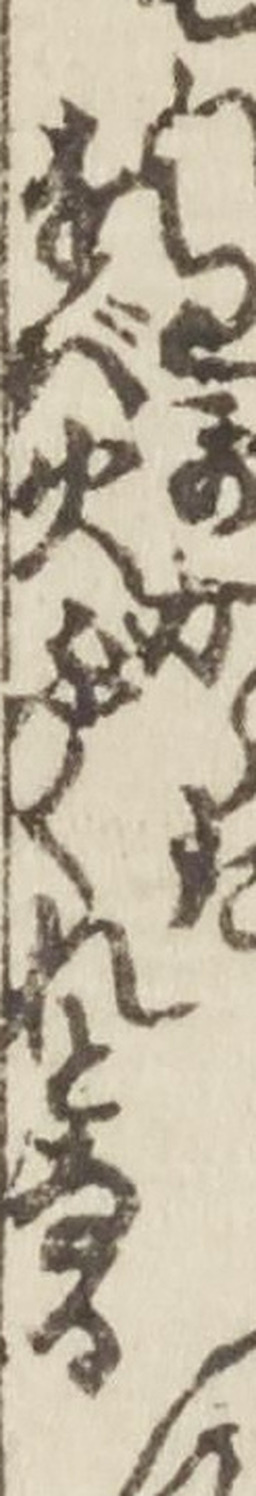をばひぶくれとなる
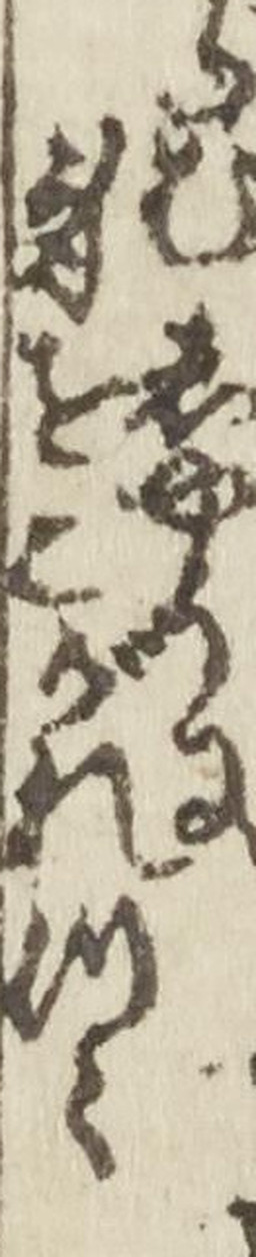身をこがれつゝ
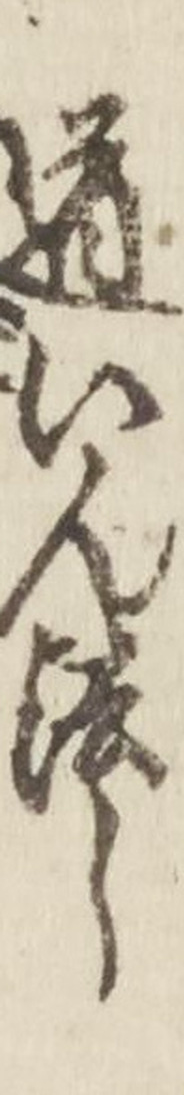道いん法し
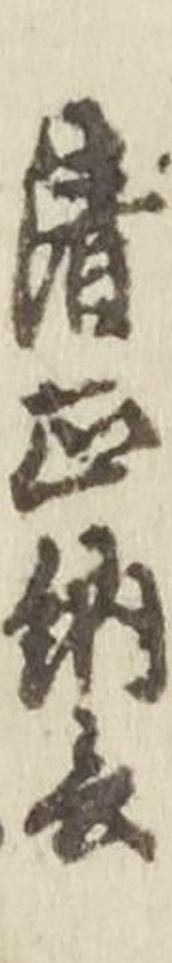清正納言
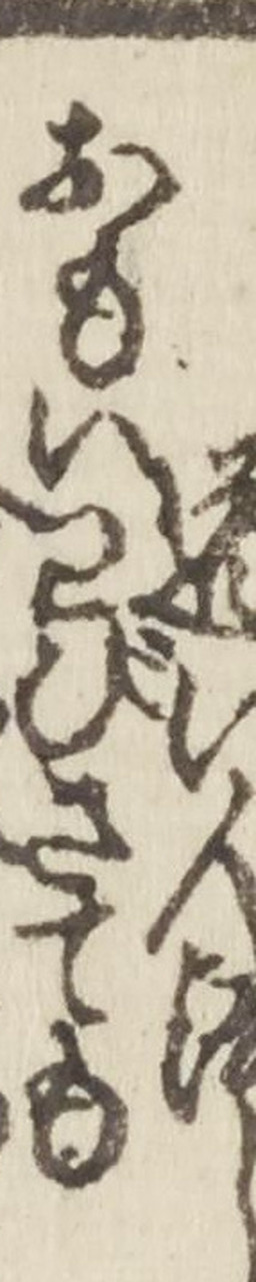おもいわびさても
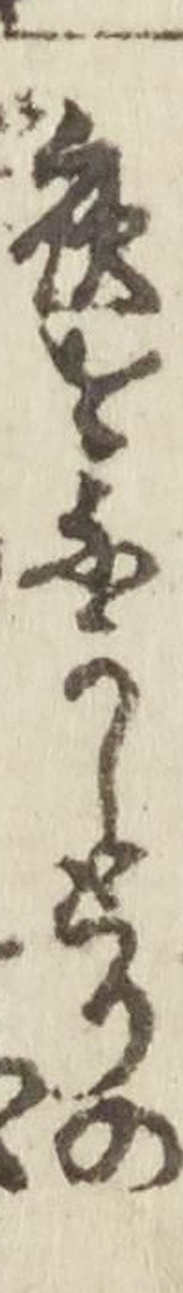夜をふかしとりの
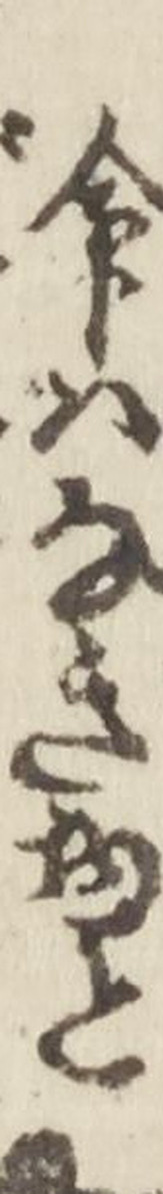命はなき物と
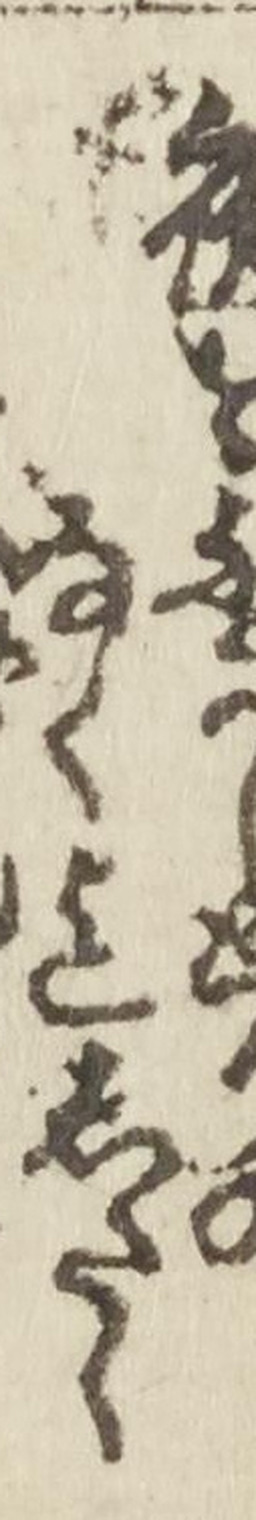なく迄したく
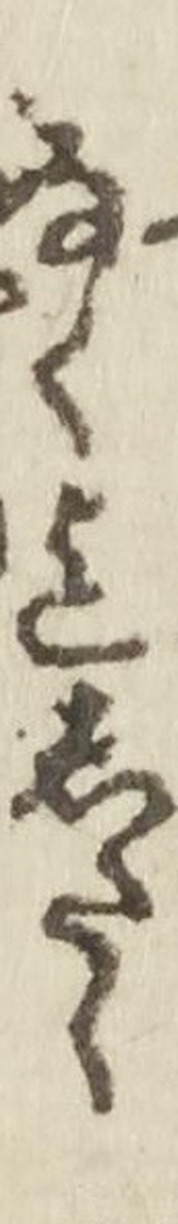なく迄したく
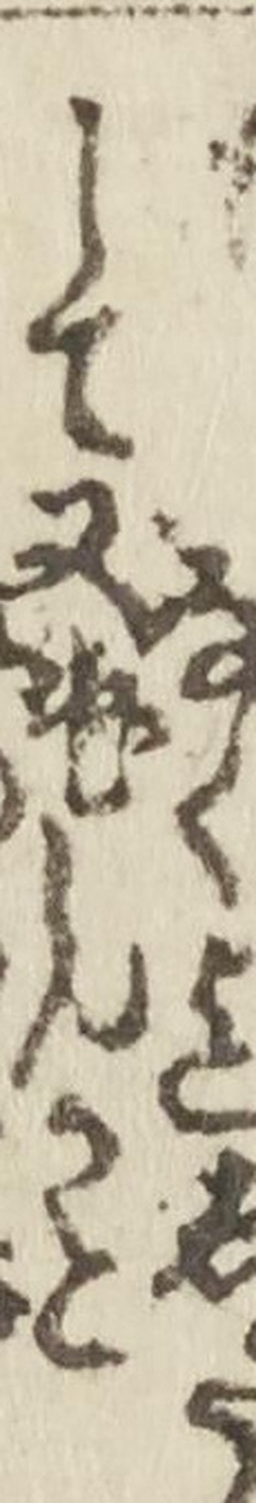して又地しんかと
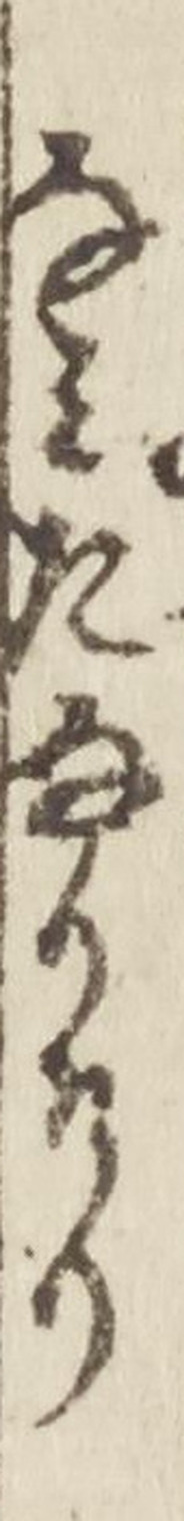なみだなりけり
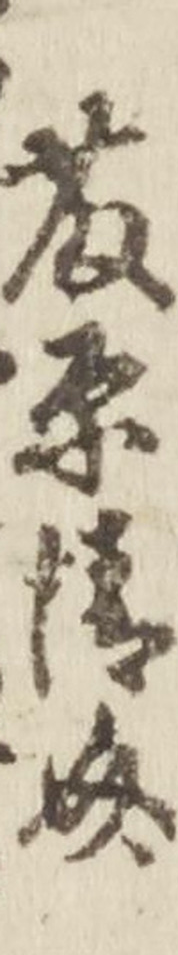藤原清介
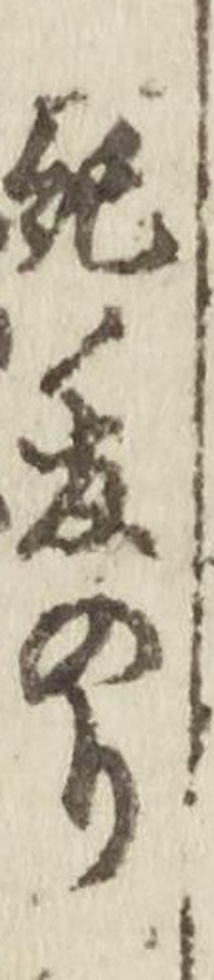紀ノ友のり
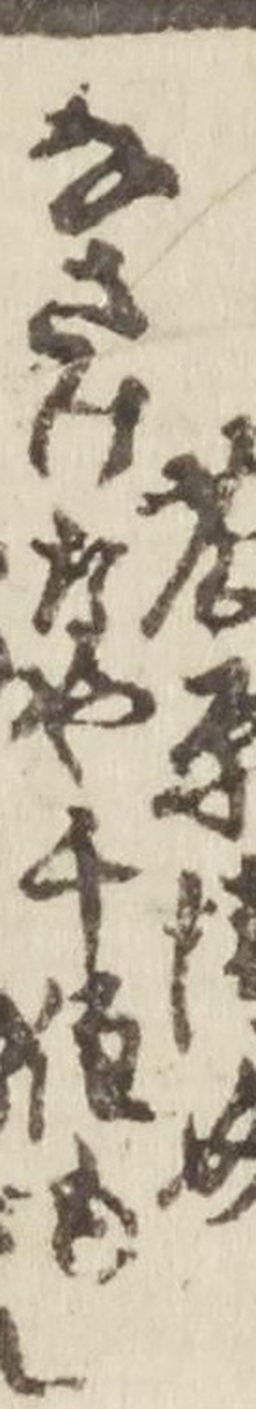なさけなや千住も
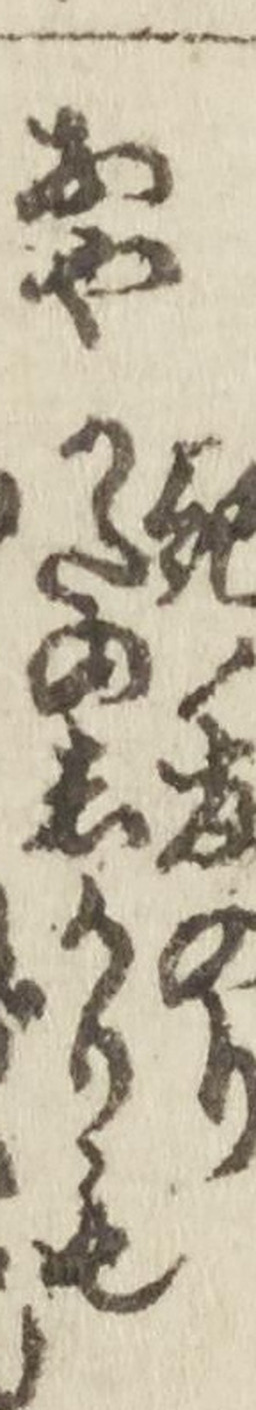おやかたのしかりも
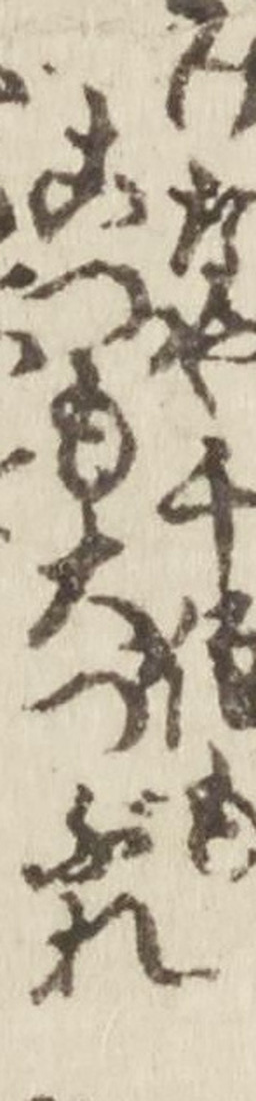こつも大つぶれ
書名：しんぱん三十六哥仙
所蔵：東京大学地震研究所図書室 Earthquake Research Institute Library, The University of Tokyo, JAPAN
